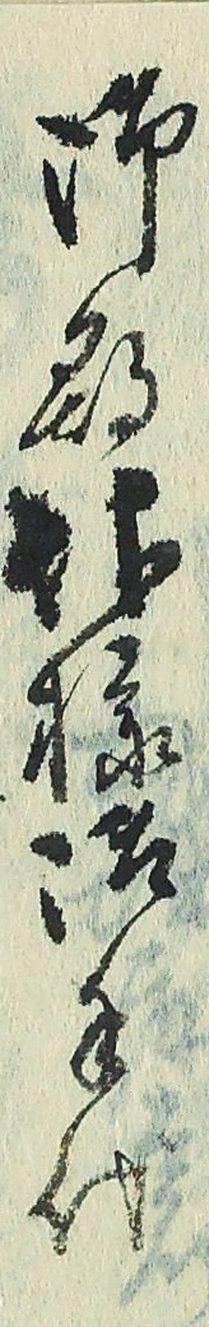御郡代様御手代
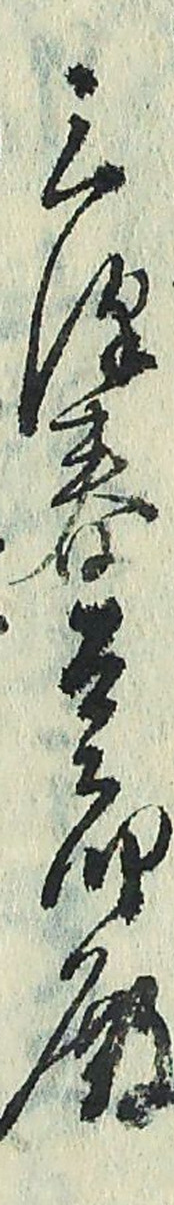三沢春太郎殿
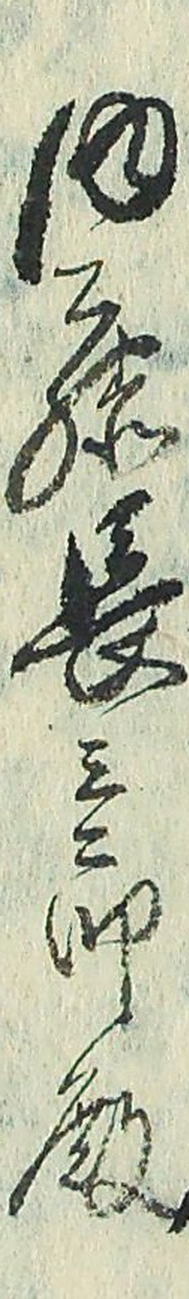内藤長三郎殿
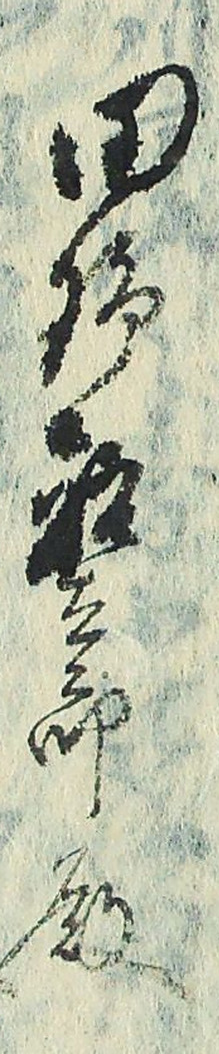田野祐太郎殿
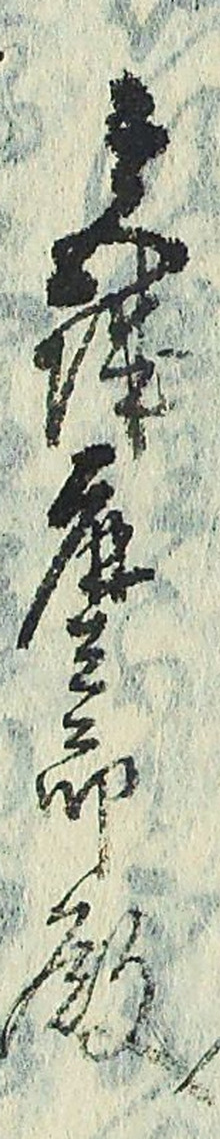宮城麻太郎殿

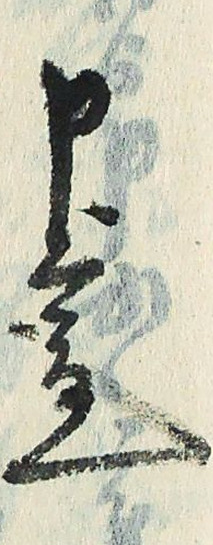申上覚
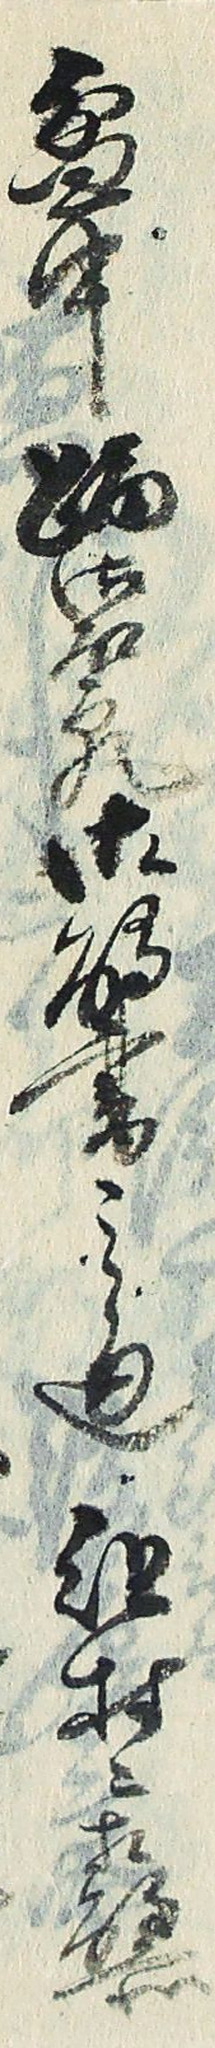盆中踊御取究御触書之通組村々相触候所
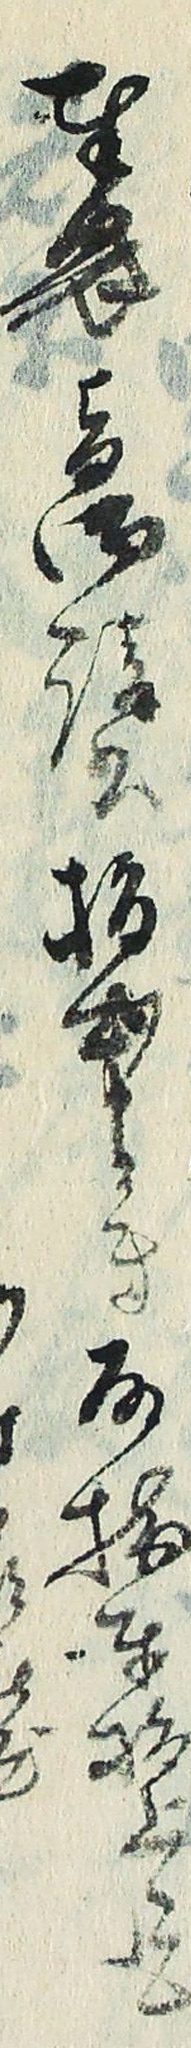奉畏旨御請書指出申に付取揃奉指上候以上
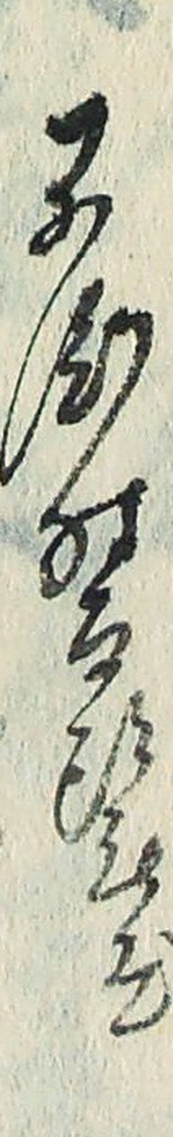早淵村与頭庄屋
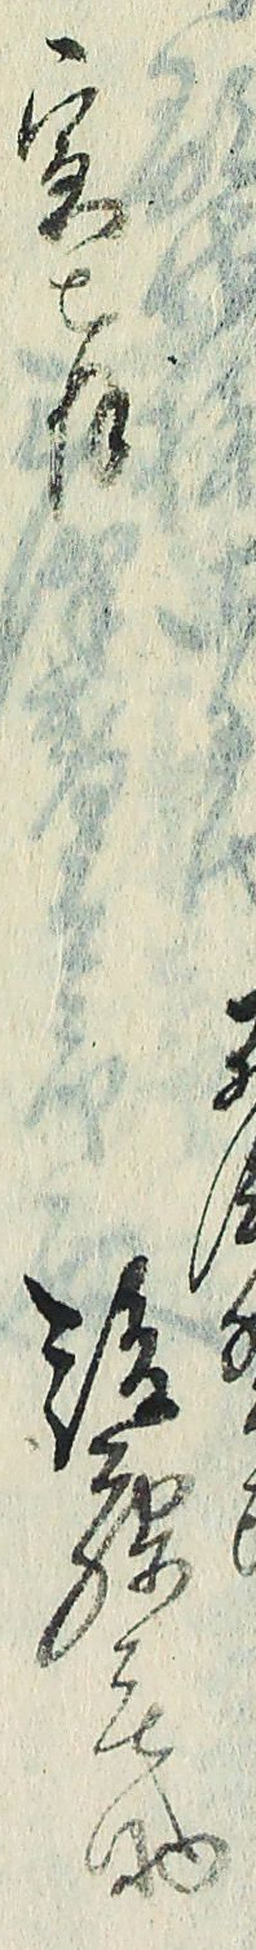寅七月後藤庄助
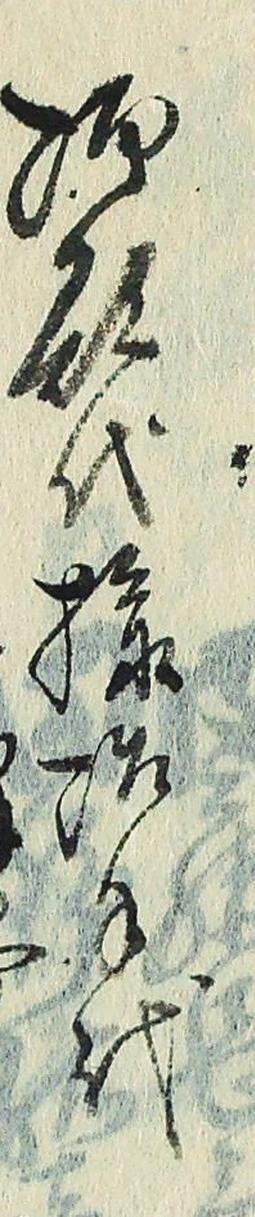御郡代様御手代
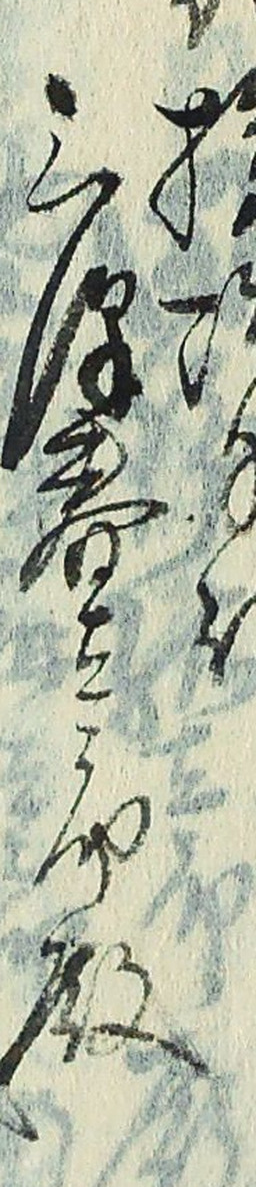三沢春太郎殿
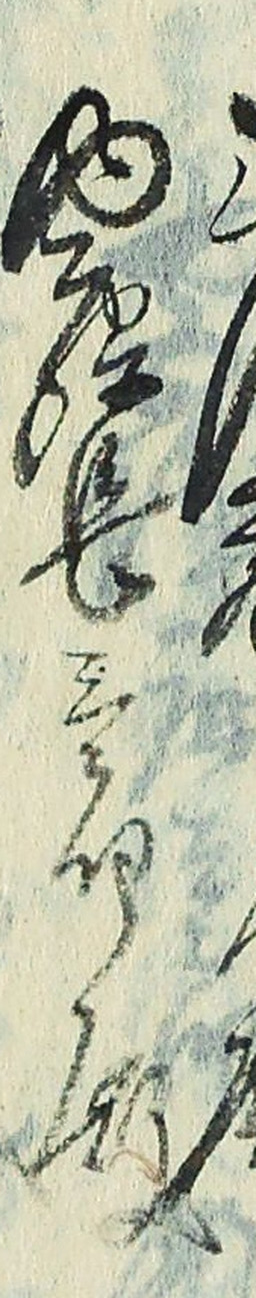内藤長三郎殿
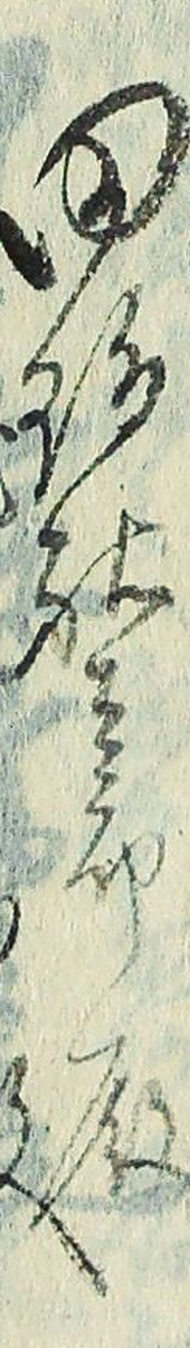田野祐太郎殿
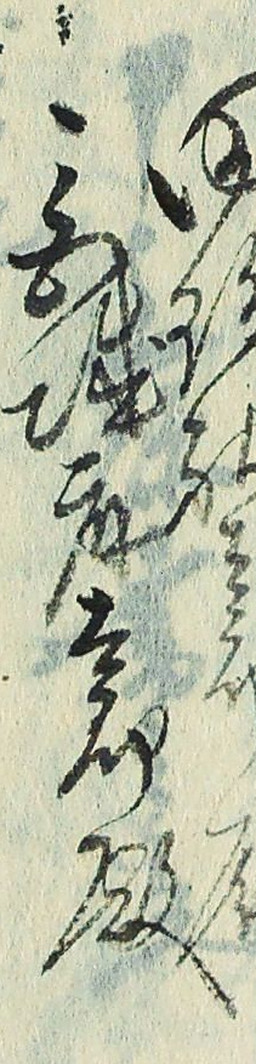宮城麻太郎殿
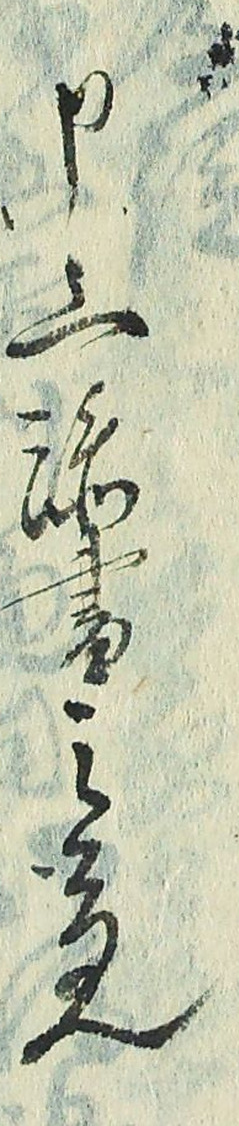申上添書之覚
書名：諸御用御□受書控
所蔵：鳴門教育大学 Naruto University of Education
